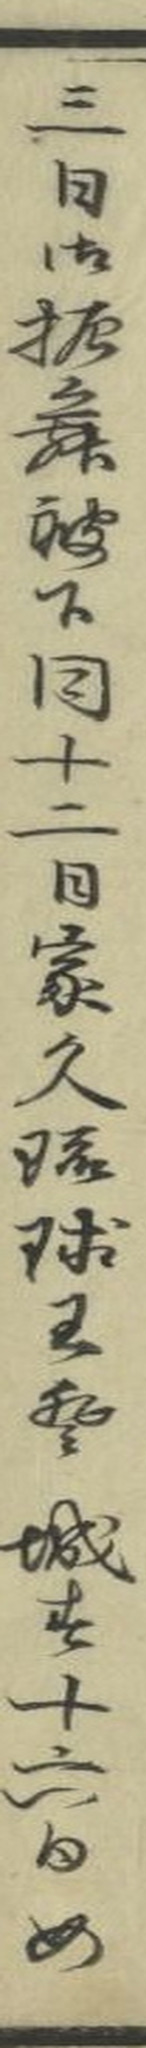三日御振舞被下同十二日家久琉球王登城す十六日め

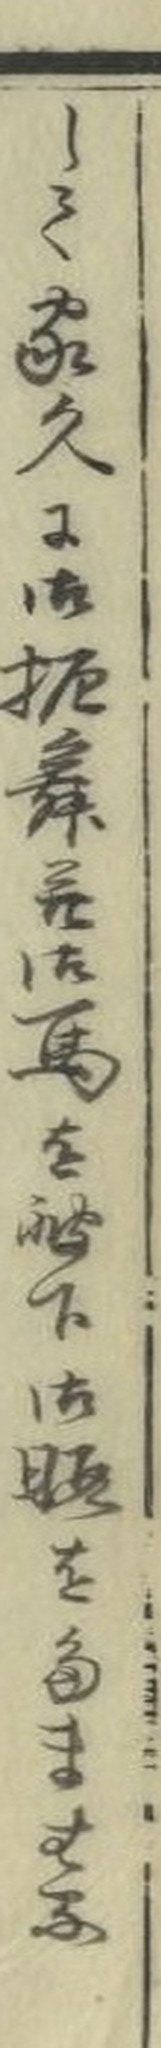して家久に御振舞幷御馬を被下御腰をたまはる
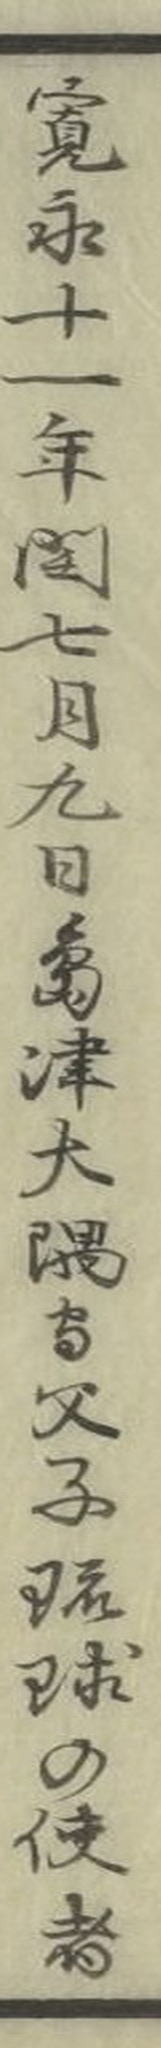寛永十一年閏七月九日島津大隅守父子琉球の使者
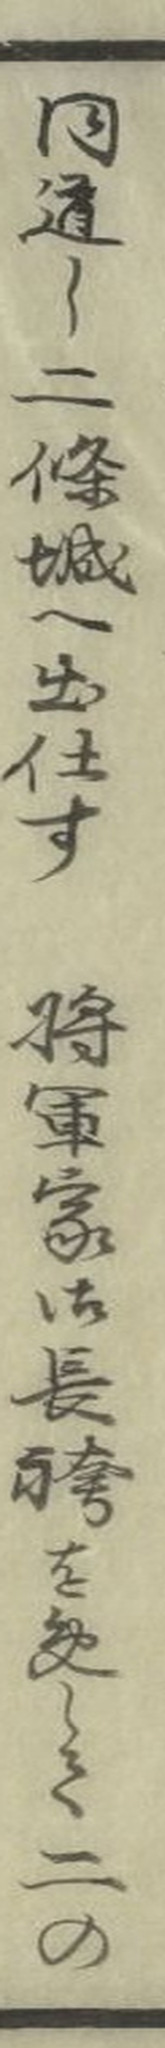同道し二条城へ出仕す将軍家御長袴をめして二の
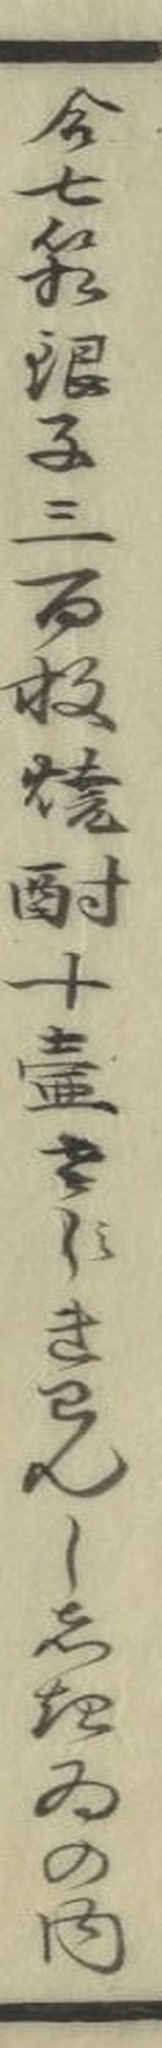合七箱銀子三百枚焼酎十壺遣之其せんししきいの内
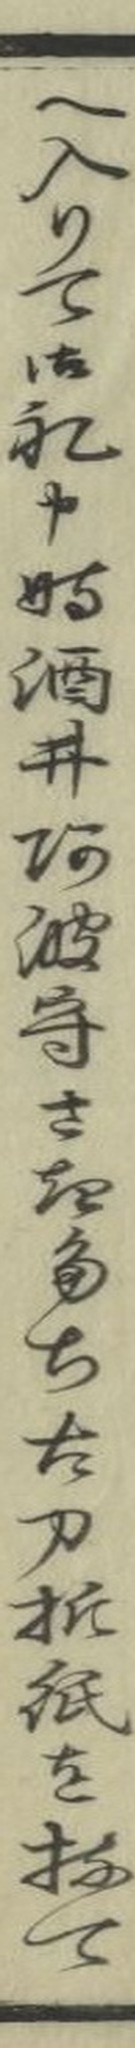へ入りて御礼申時酒井阿波守さきたち太刀折紙を持て
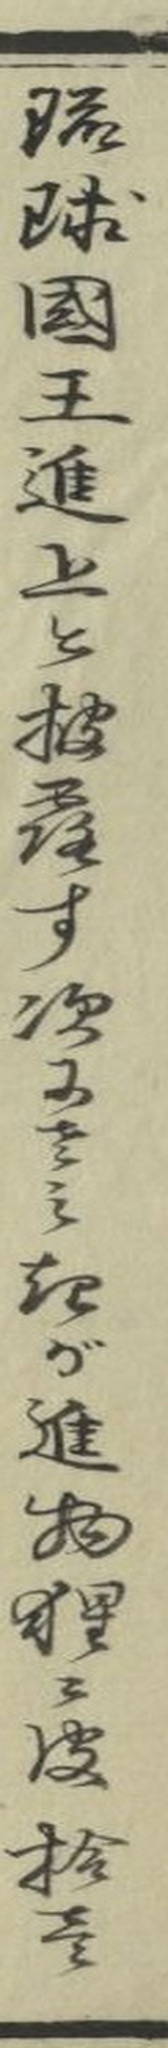琉球国王進上と披露す次にさのきが進物猩々皮拾一
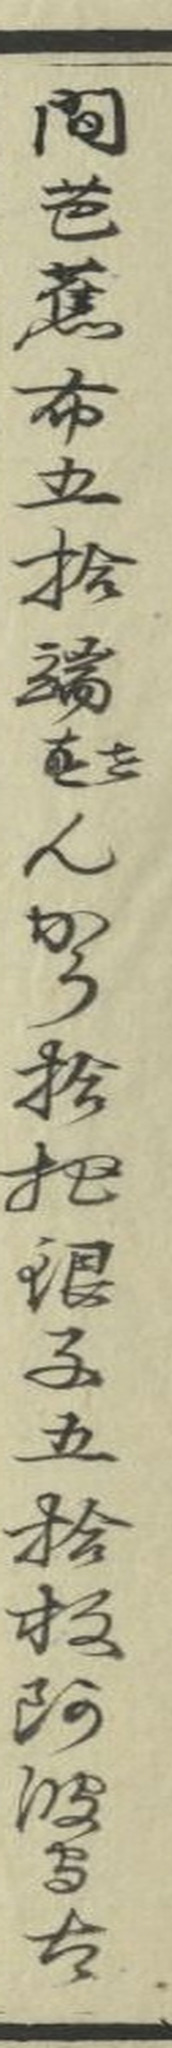間芭蕉布五拾端せんかう拾把銀子五拾枚阿波守太
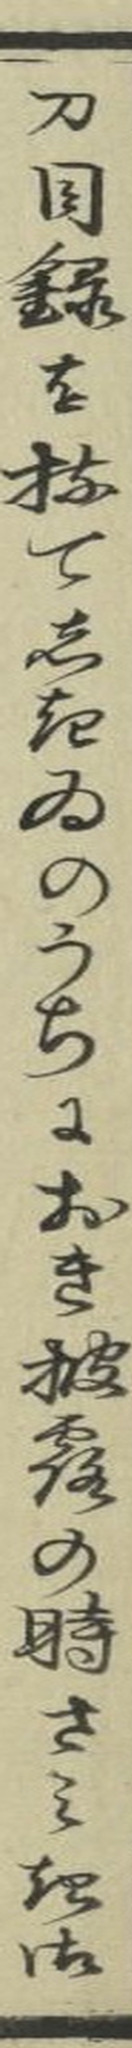刀目録を持てしきいのうちにおき披露の時さのき御
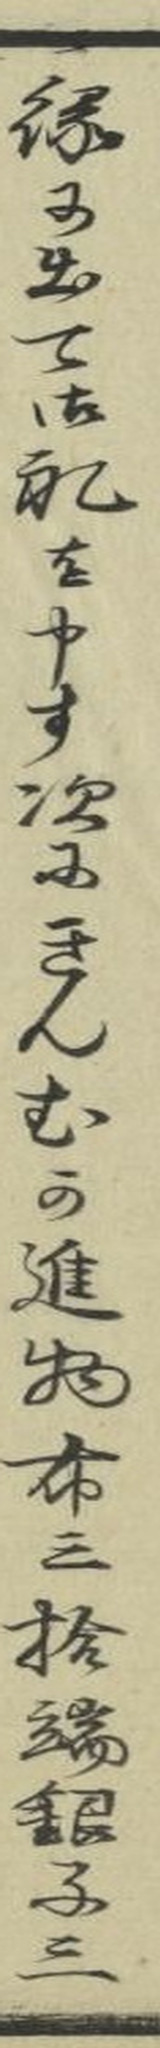縁に出て御礼を申す次にきんむか進物布三拾端銀子三
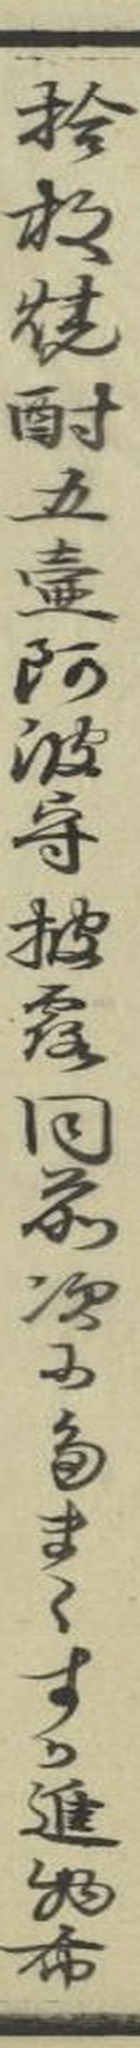拾枚焼酎五壺阿波守披露同前次にたまくすり進物布
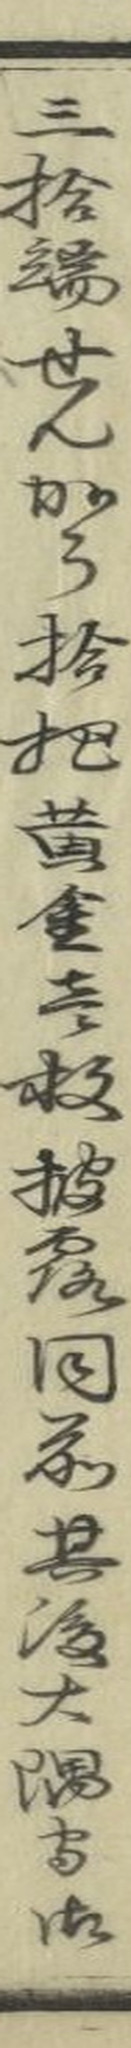三拾端せんかう拾把黄金一枚披露同前其後大隅守御
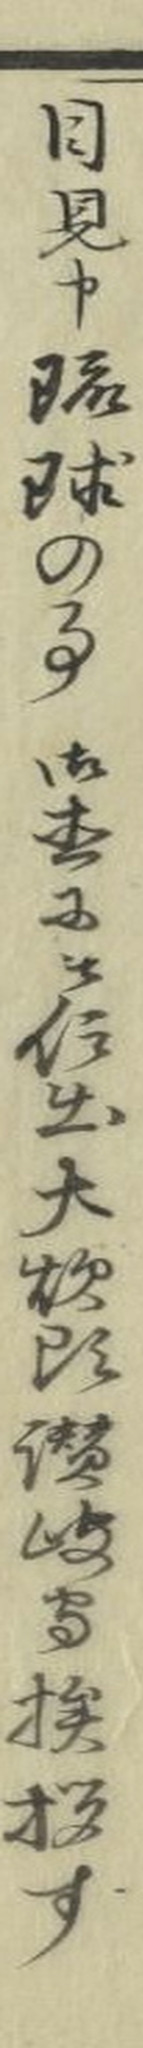目見申琉球の事御直に被仰出大炊頭讃岐守挨拶す
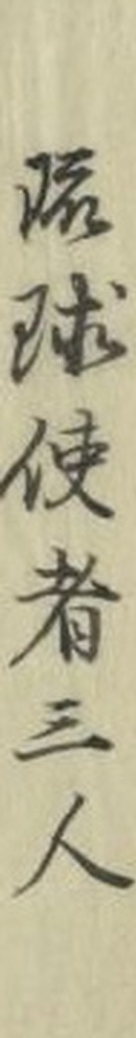琉球使者三人
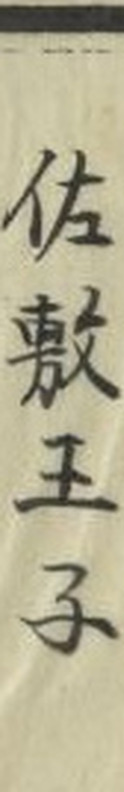佐敷王子
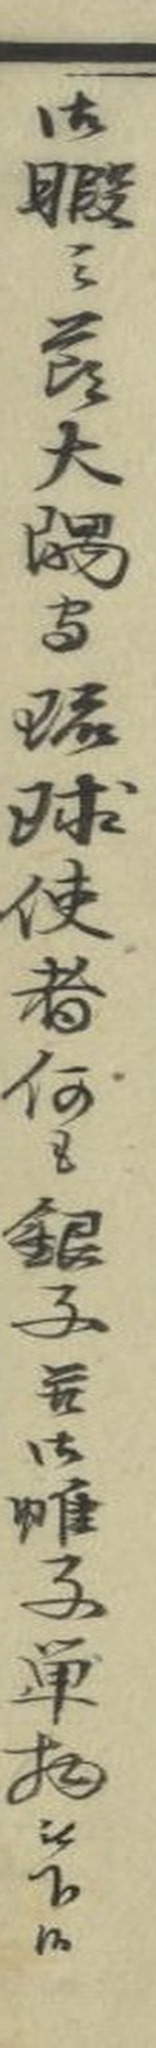御暇之節大隅守琉球使者何も銀子並御帷子単物被下候
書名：琉球往来（上）
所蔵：University of the Ryukyus Library
